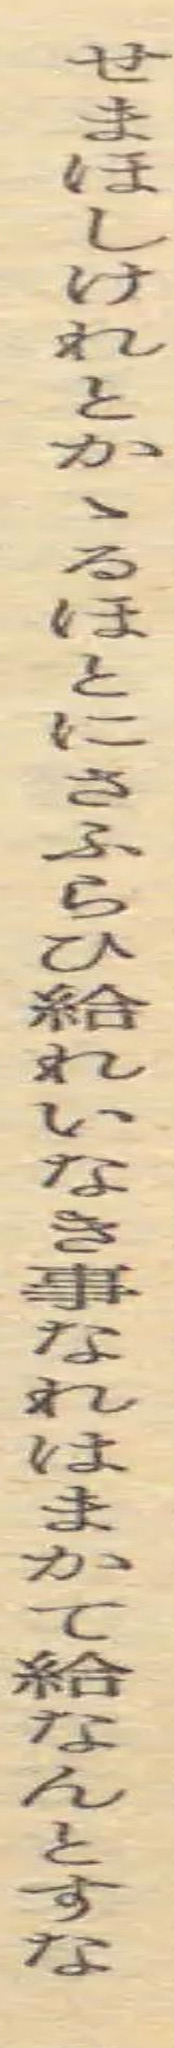せまほしけれとかゝるほとにさふらひ給れいなき事なれはまかて給なんとすな
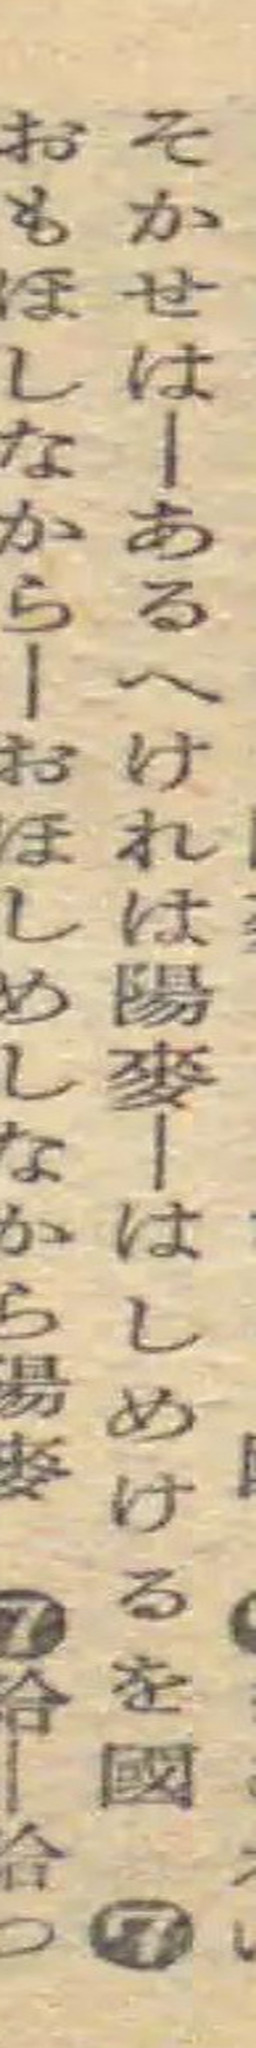おもほしなから―おほしめしなから陽麦❼給―給つ
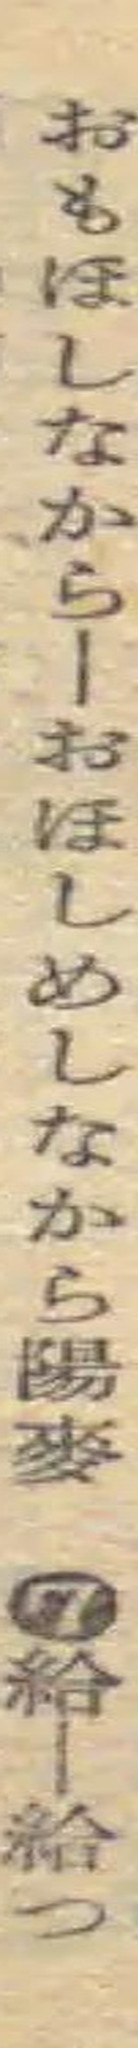おもほしなから―おほしめしなから陽麦❼給―給つ
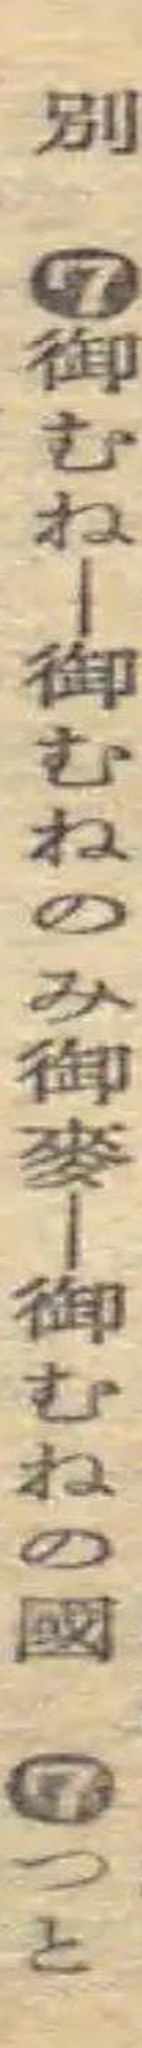別❼御むね―御むねのみ御麦―御むねの国❼つと
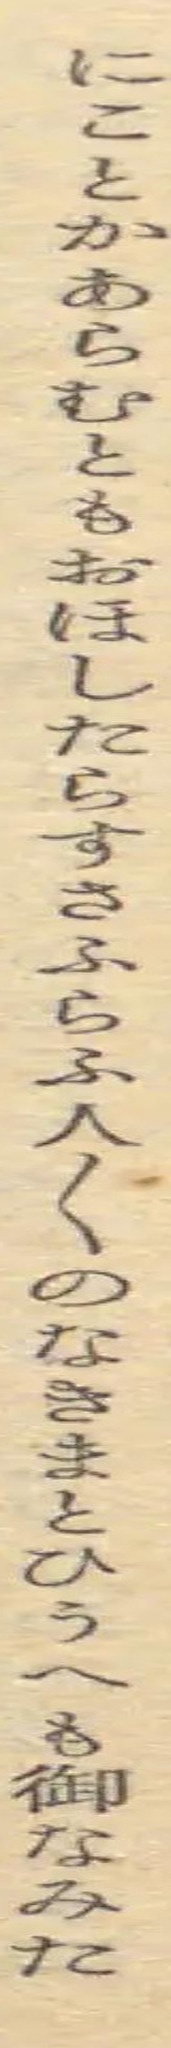にことかあらむともおほしたらすさふらふ人〳〵のなきまとひうへも御なみた
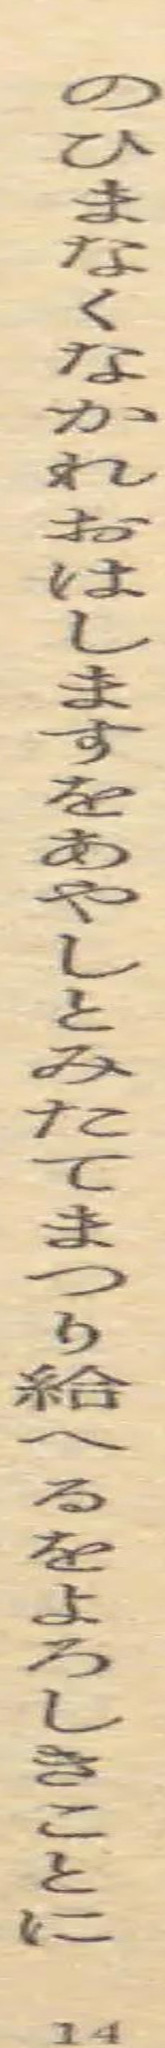のひまなくなかれおはしますをあやしとみたてまつり給へるをよろしきことに
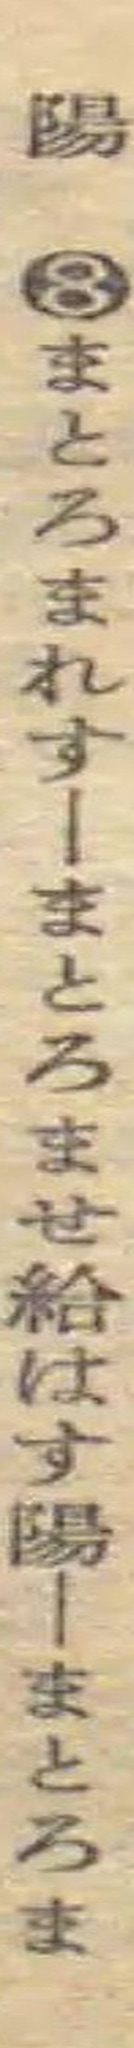陽❽まとろまれす―まとろませ給はす陽―まとろま
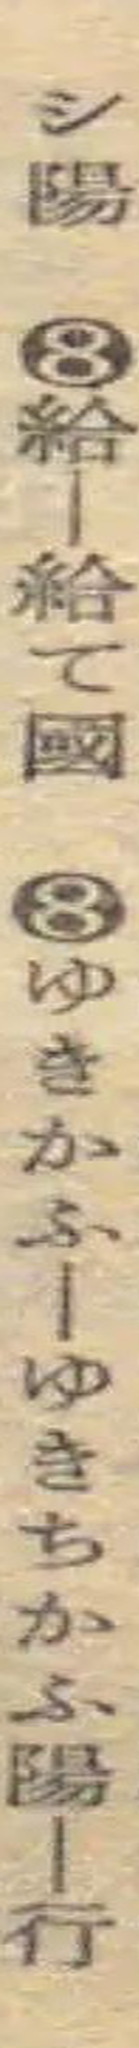シ陽❽給―給て国❽ゆきかふ―ゆきちかふ陽―行
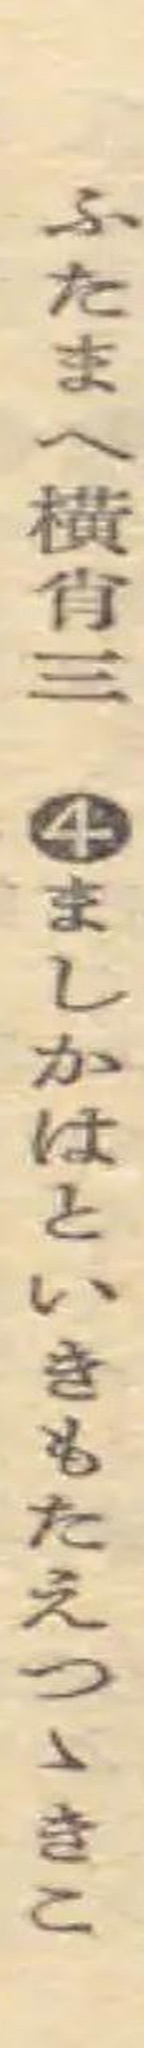ふたまへ横肖三❹ましかはといきもたえつゝきこ
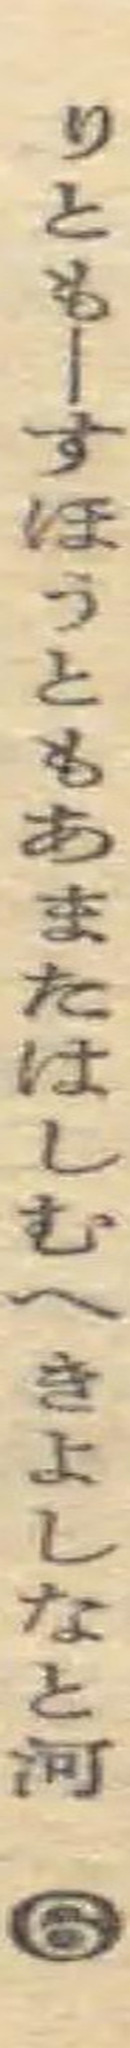りとも―すほうともあまたはしむへきよしなと河❻
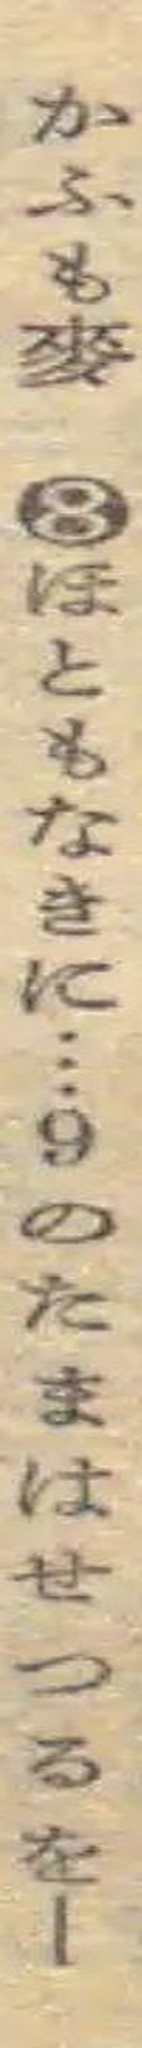かふも麦❽ほともなきに…９のたまはせつるを―
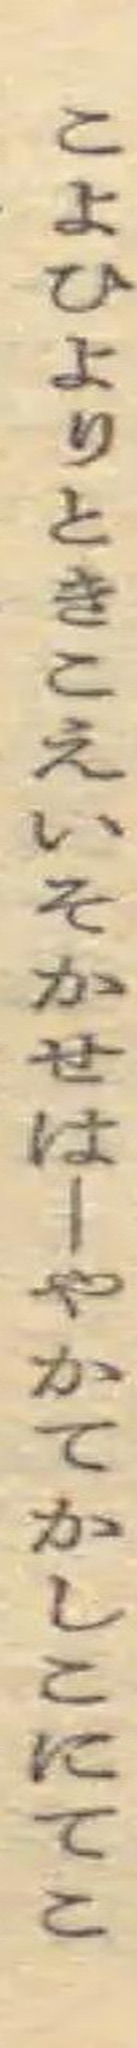こよひよりときこえいそかせは―やかてかしこにてこ
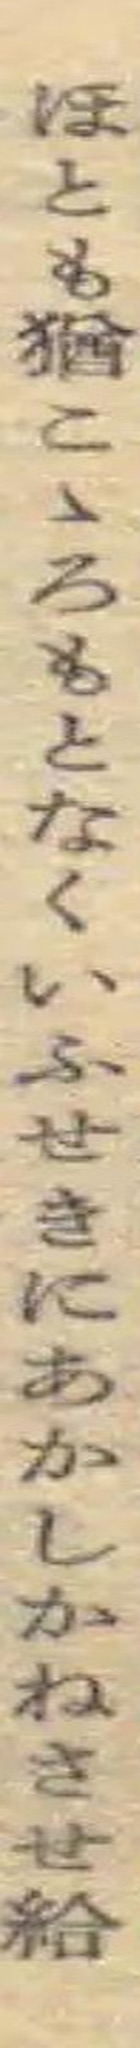ほとも猶こゝろもとなくいふせきにあかしかねさせ給
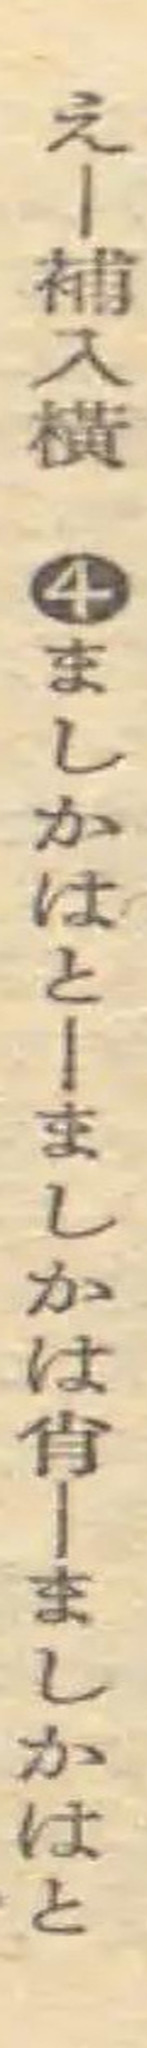え―補入横❹ましかはと―ましかは肖―ましかはと
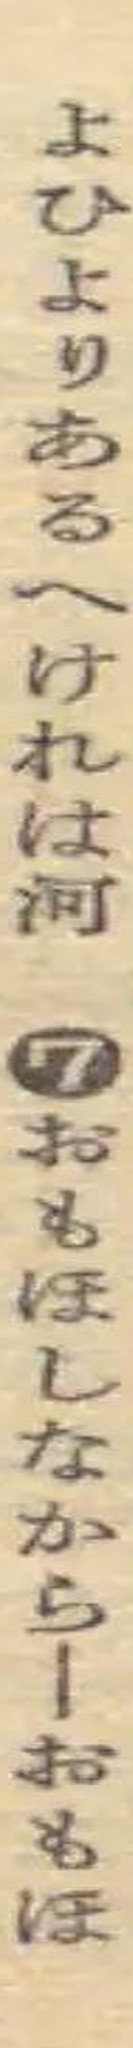よひよりあるへけれは河❼おもほしなから―おもほ
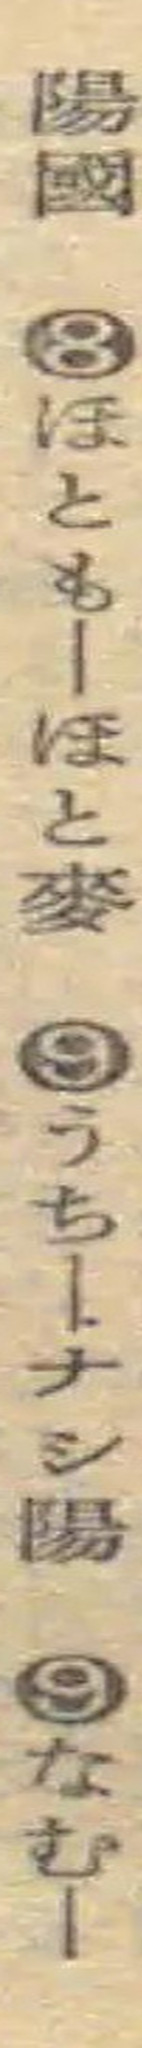陽国❽ほとも―ほと麦❾うち―ナシ陽❾なむ―
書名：校異源氏物語.
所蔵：国立国会図書館 National Diet Library, JAPAN
